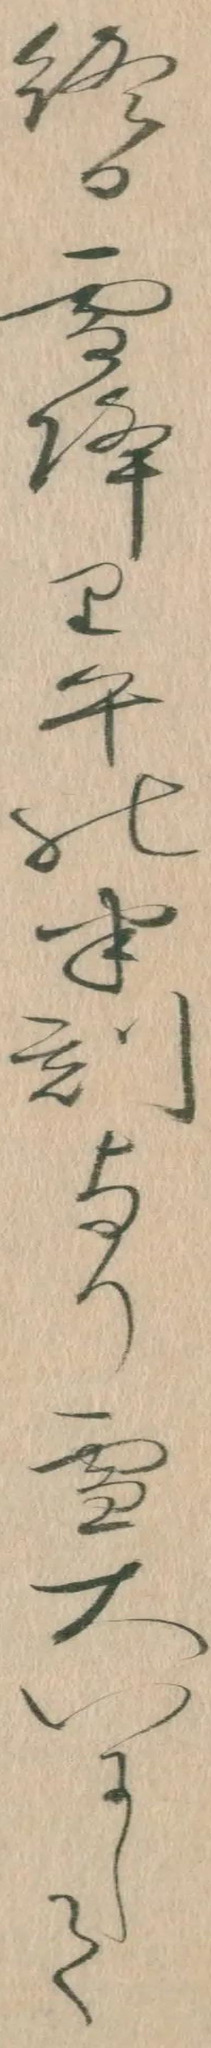終日雪降り午の半刻より雪大いにして
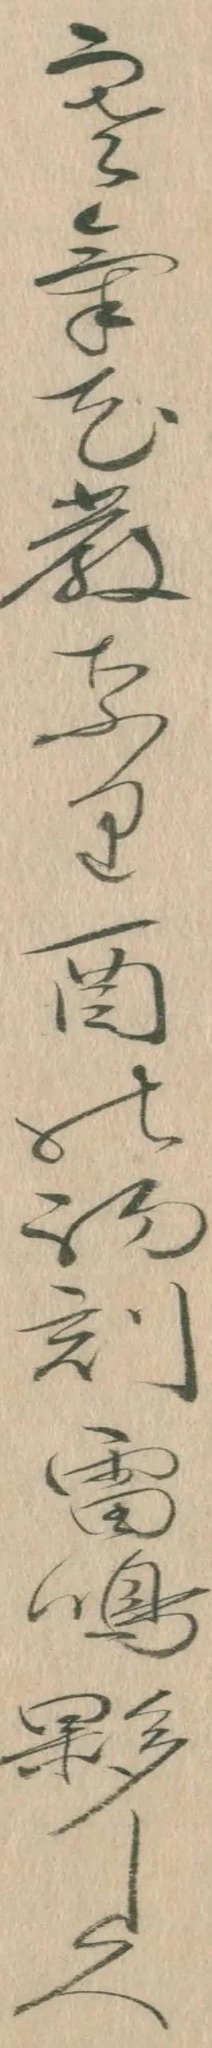寒気尤厳なり酉の初刻雷鳴夥しく
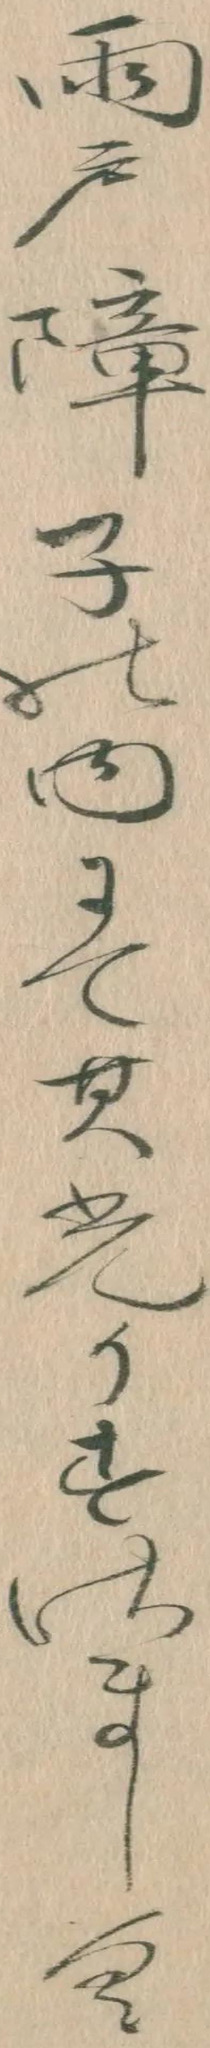雨戸障子の内まて其光りすさましく
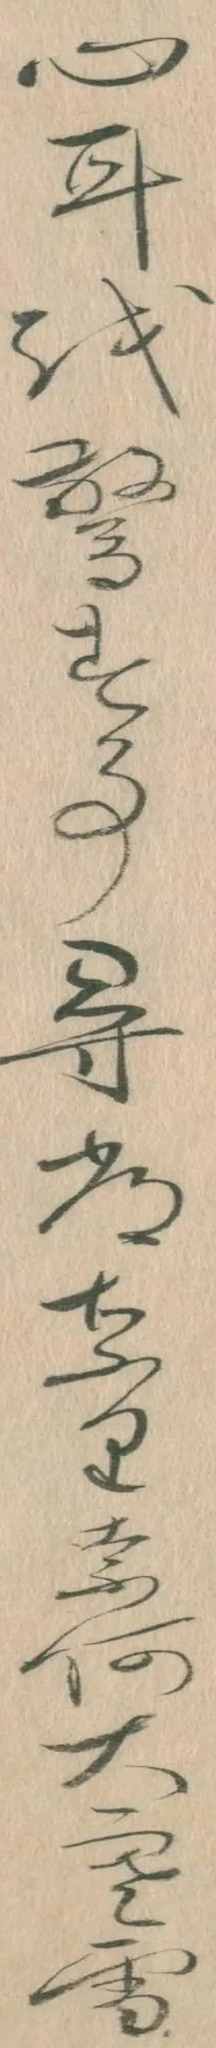心耳を驚す事尋常なり奈何大寒雪
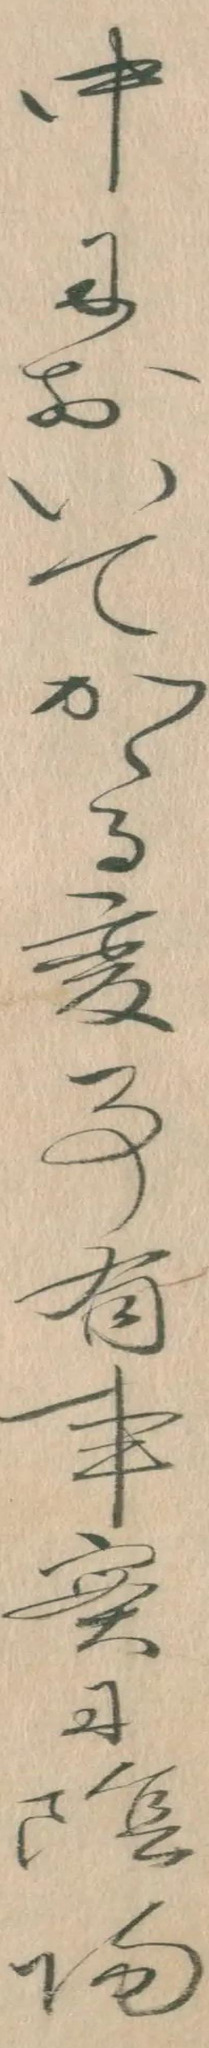中においてかゝる変事有事実に陰陽
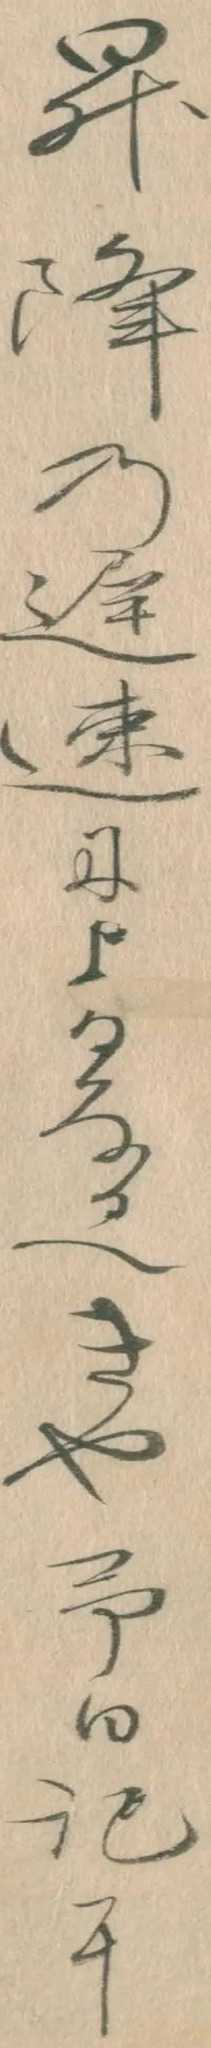昇降の遅速によるなるへきや予日記に
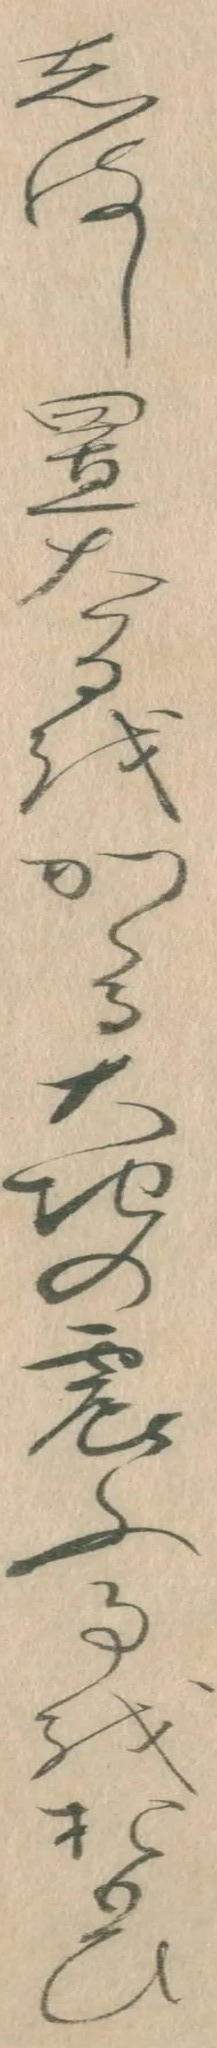しるし置たるをかゝる大地の震ふ事をおもひ

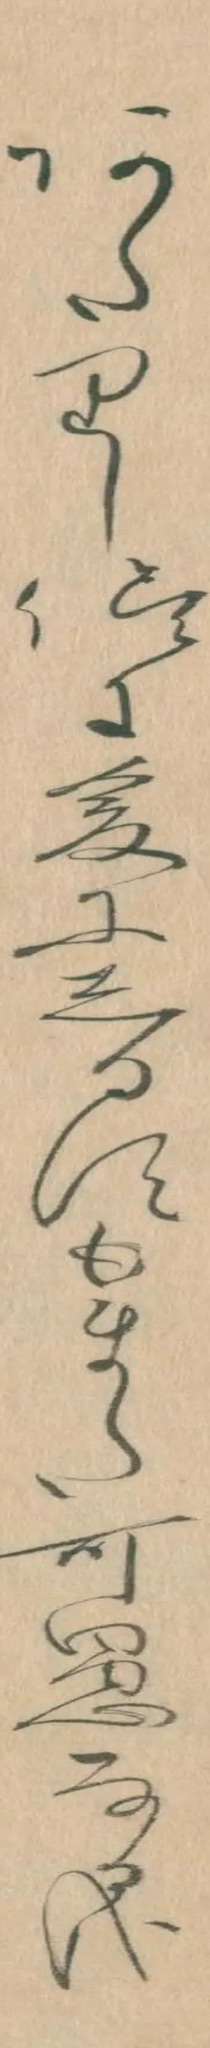あたりし侭に爰にしるすもまた可愚なる哉
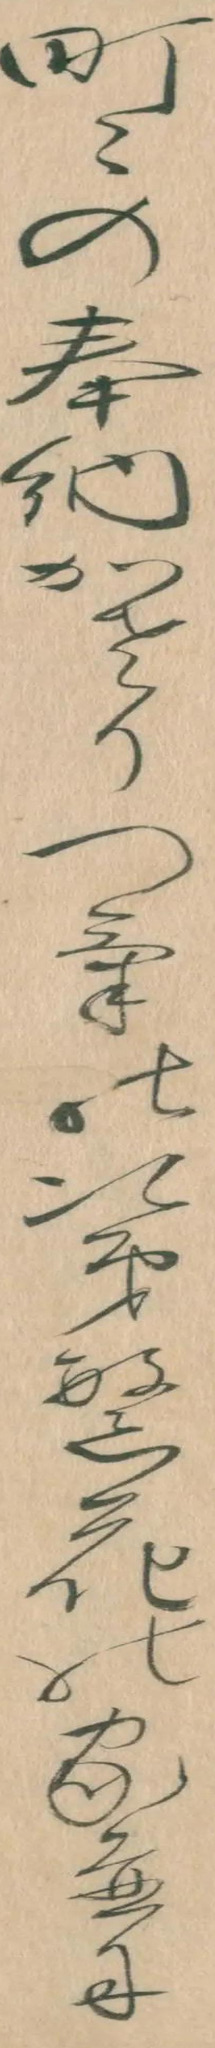町々の奉納かざりつけの次第繁花の家並に
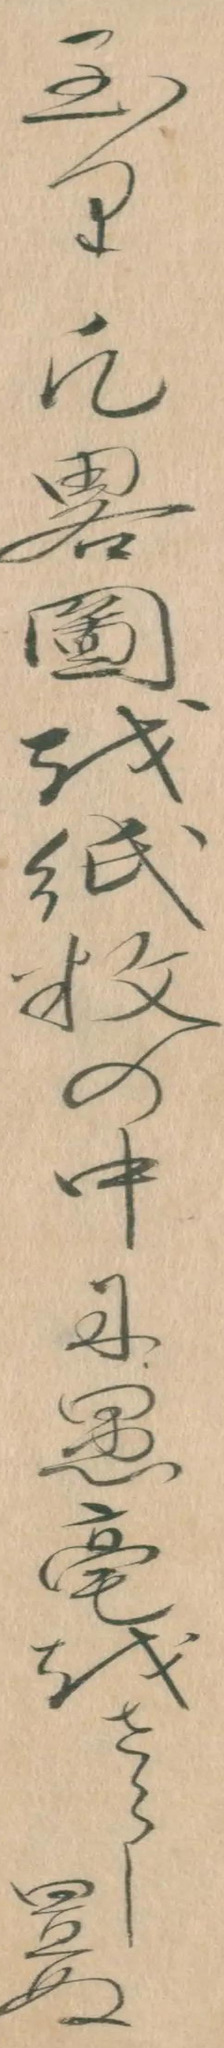至り凡略図を紙数の中に愚毫をさらし置ぬ
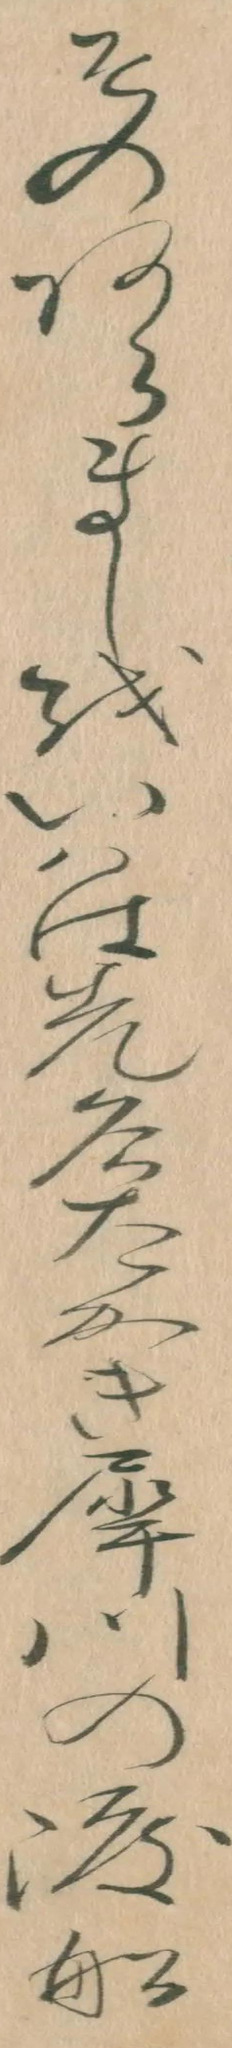そのあらましをいはは先名たかき犀川の渡船
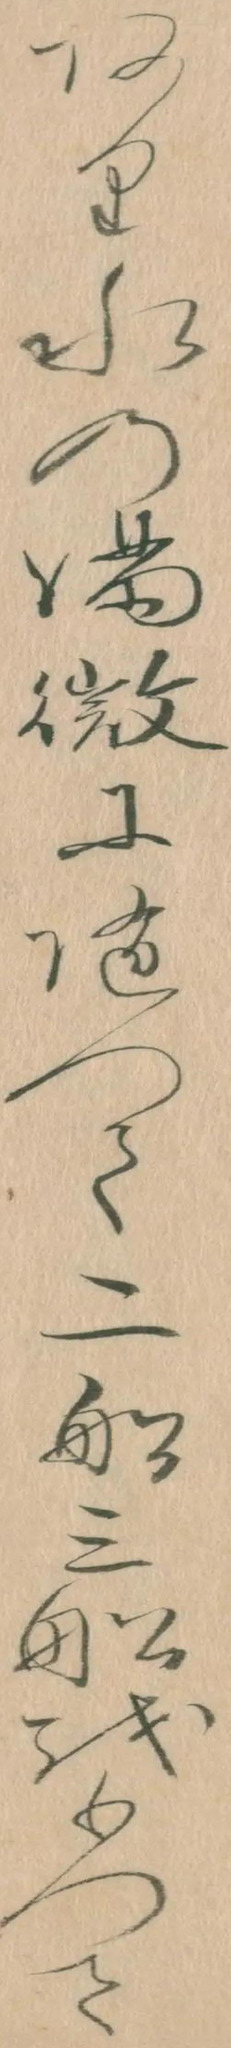あり水の満微に随つて二船三船をもつて
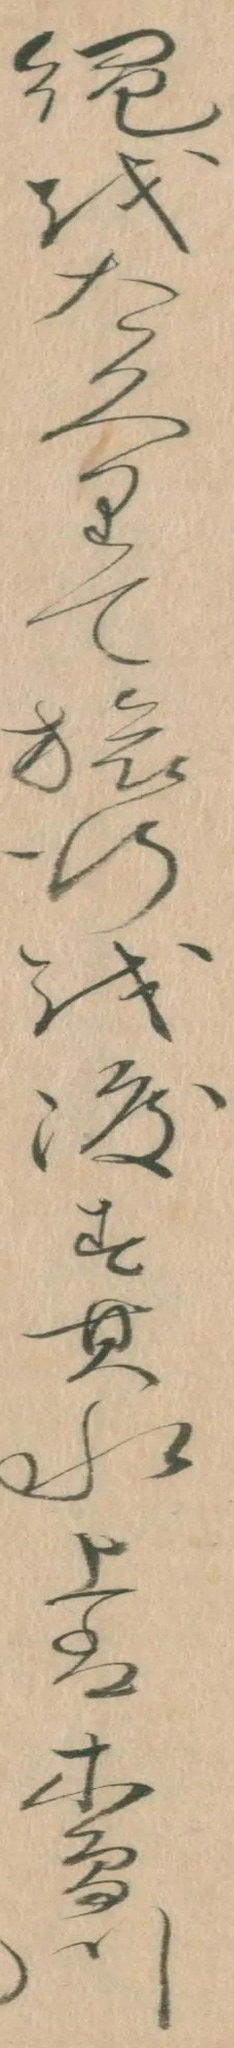縄をたくりて旅行を渡す其水上は木曽川
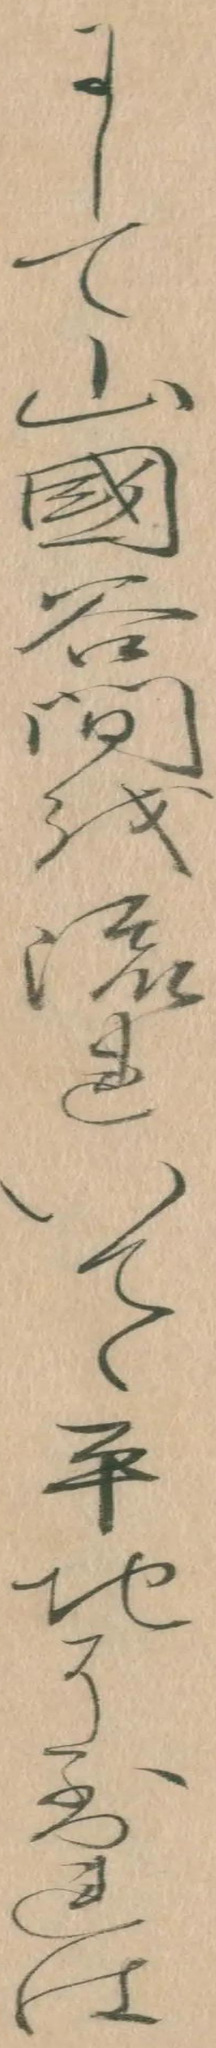にして山国谷間を流れいてて平地に至れは
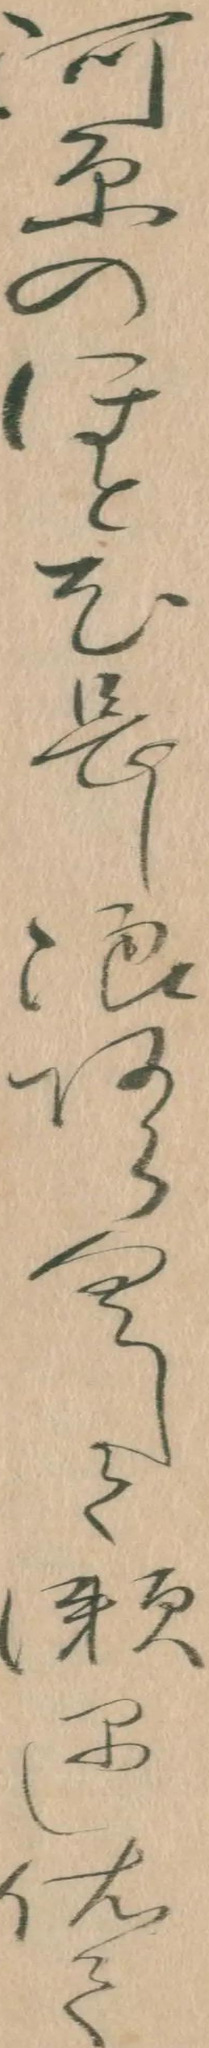河原のほと尤長し浪あらくして瀬早し伏て
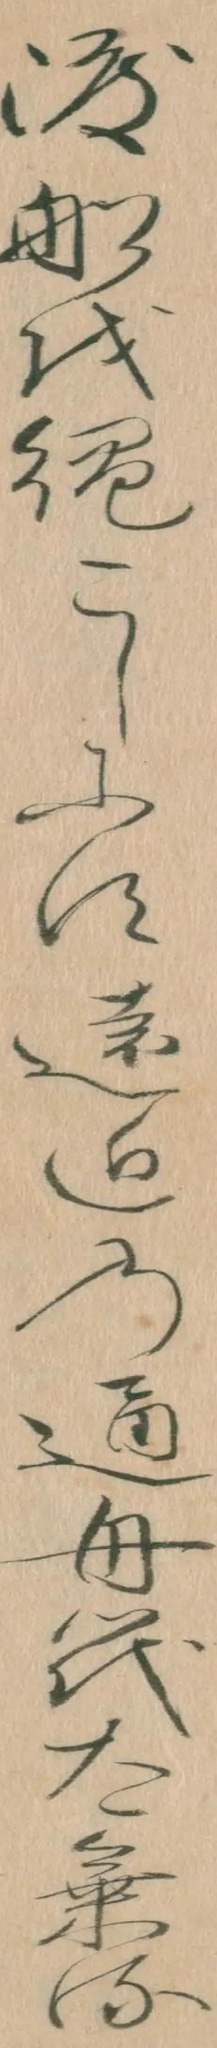渡船を縄こしにす遠近の通舟茂た乗る
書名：俗語之種. [1]
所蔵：国立国会図書館 National Diet Library, JAPAN
